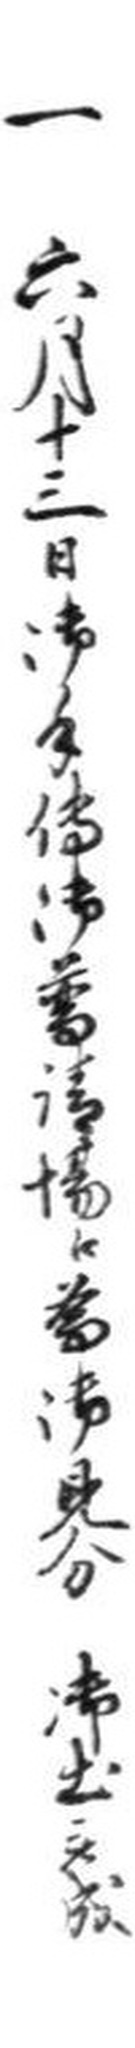一六月十三日御手伝普請場江為御見分御出被成
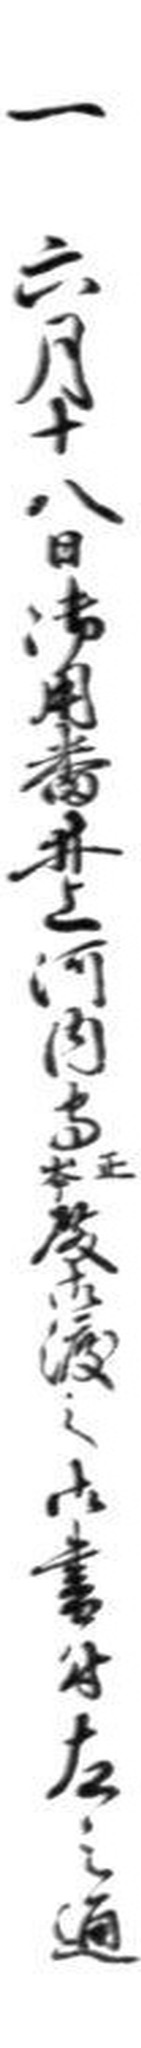一六月十八日御用番井上河内守正岑殿御渡之御書付左之通
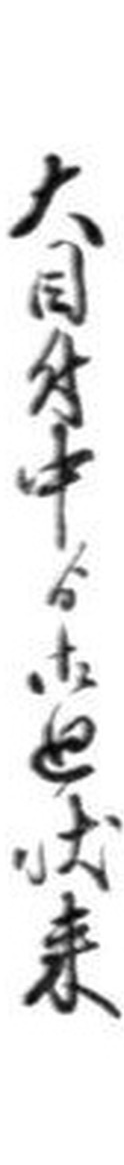大目付中ゟ御廻状来
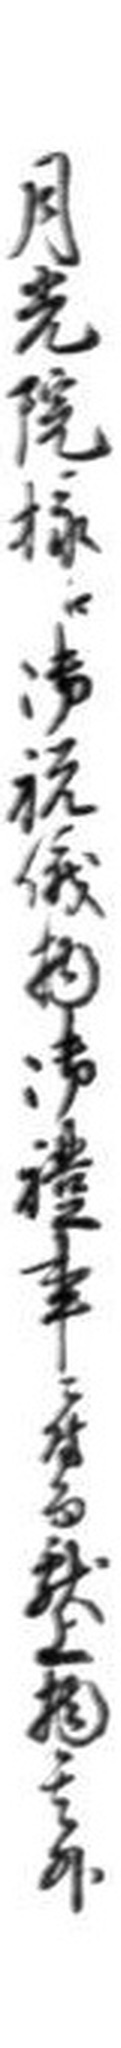月光院様江御祝儀物御礼事ニ付而献上物其外
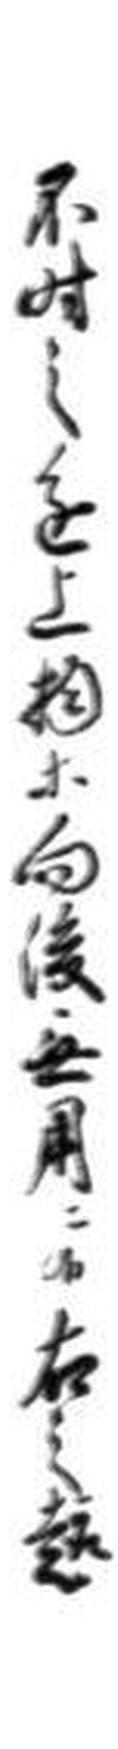不時之進上物等向後無用ニ候右之趣
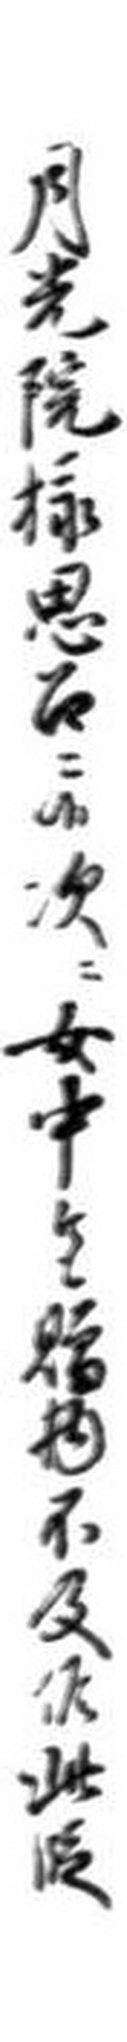月光院様思召ニ候次ニ女中江も贈物不及候此段
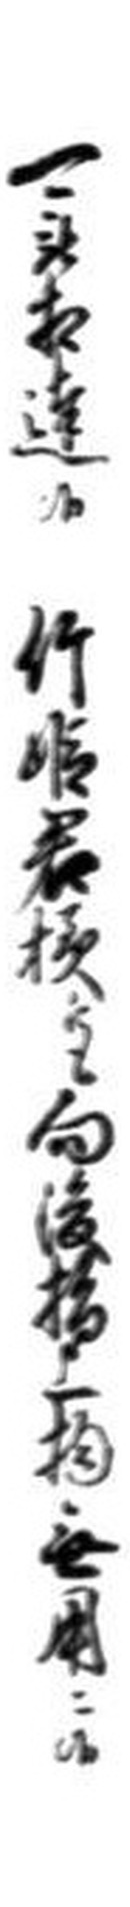可被相達候竹姫君様江も向後指上物無用ニ候
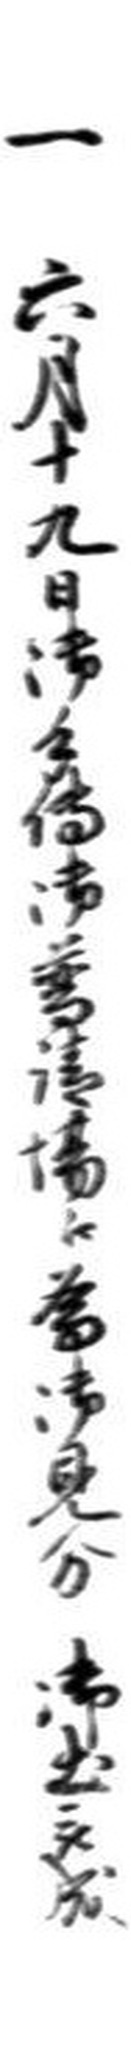一六月十九日御手伝御普請場江為御見分御出被成
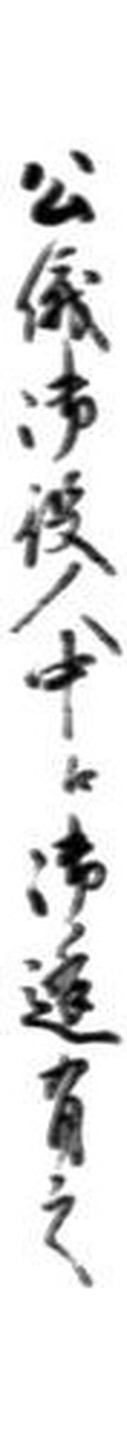公儀御役人中江御逢有之
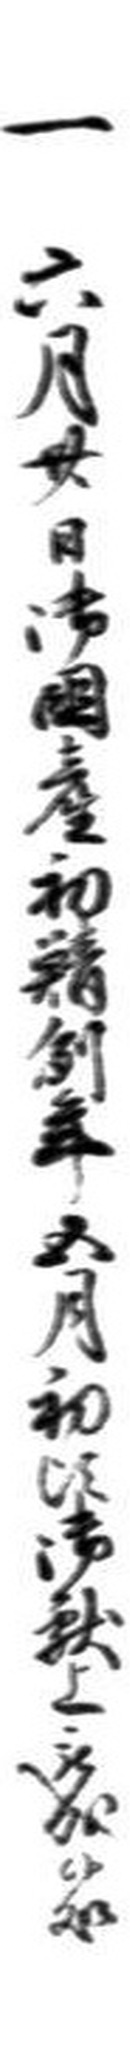一六月廿日御国産初鯖例年五月初頃御献上被成候処
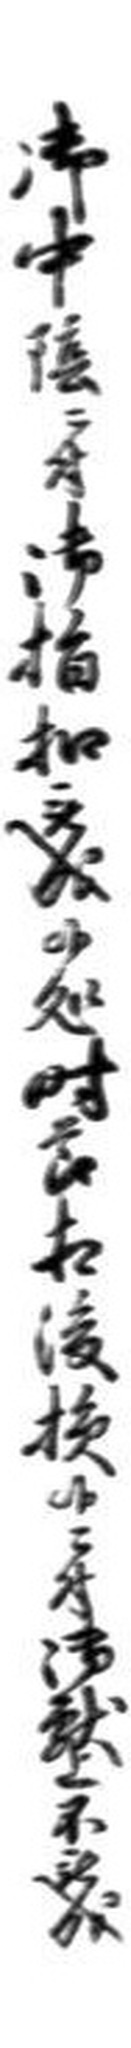御中陰ニ付御指扣被成候処時節相後損候ニ付御献上不被成

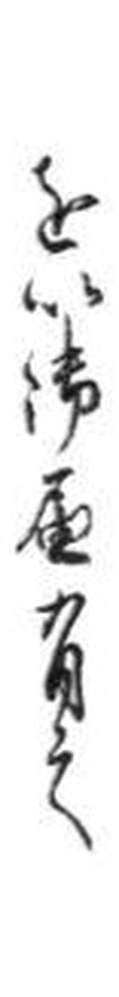を以御届有之
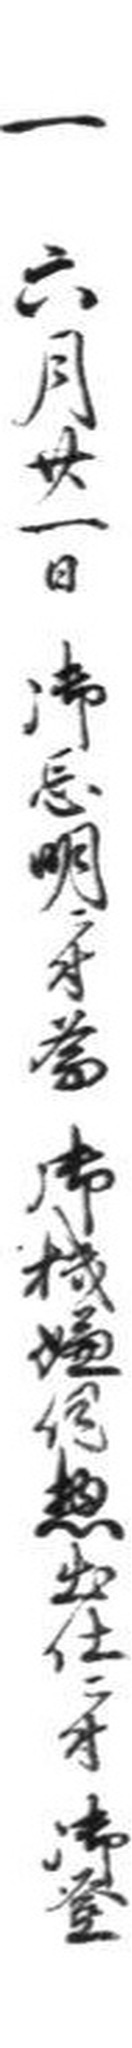一六月廿一日御忌明ニ付為御機嫌伺惣出仕ニ付御登
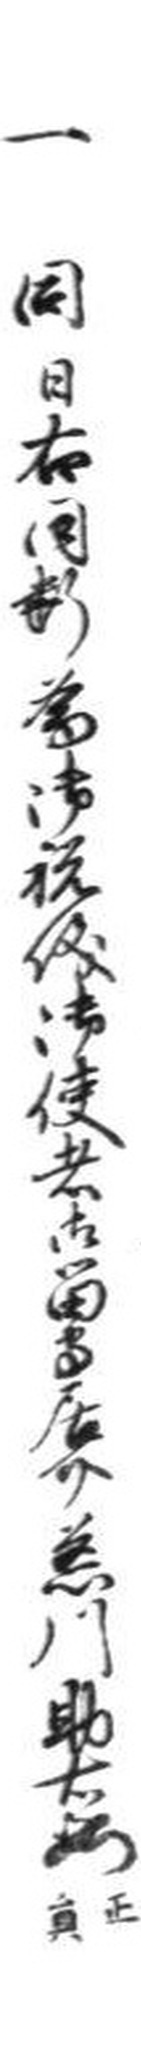一同日右同断為御祝儀御使者御留守居介荒川助右衛門正員
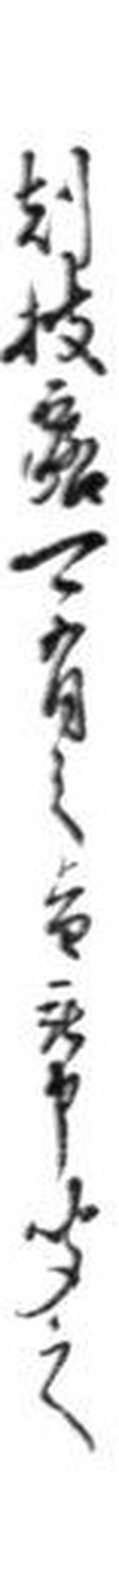刻披露可有之旨被申聞之
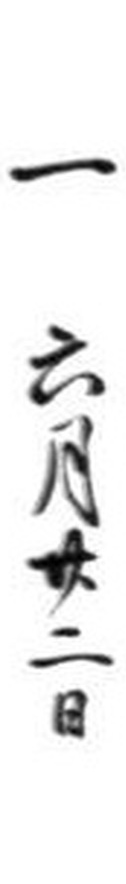一六月廿二日
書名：家譜 三十一 吉邦公 享保元年
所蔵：福井県文書館 Fukui Prefectural Archives
